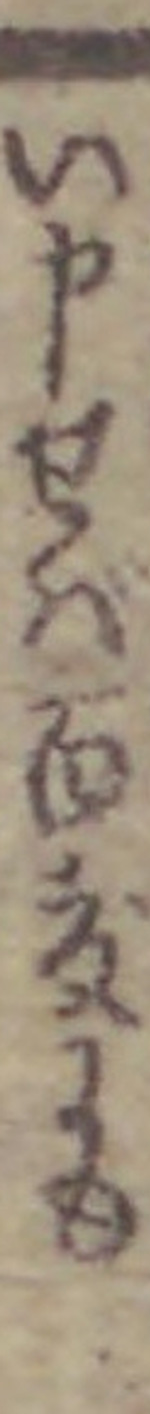い申せば百度にも
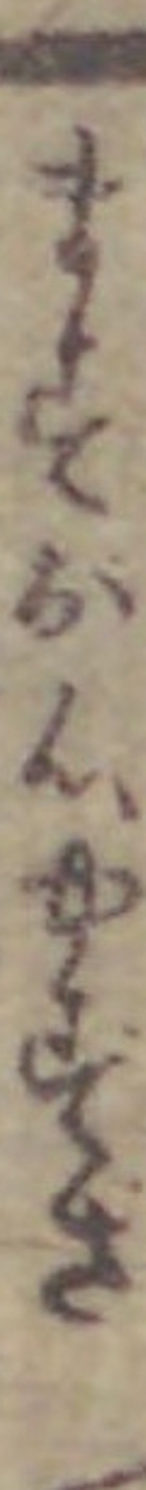ますお心やすさ
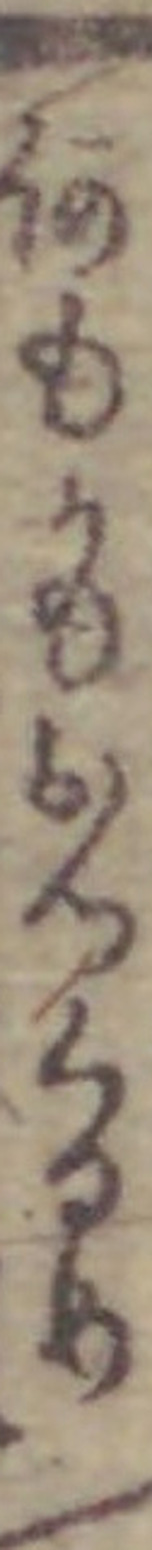何もかもおつくるめ
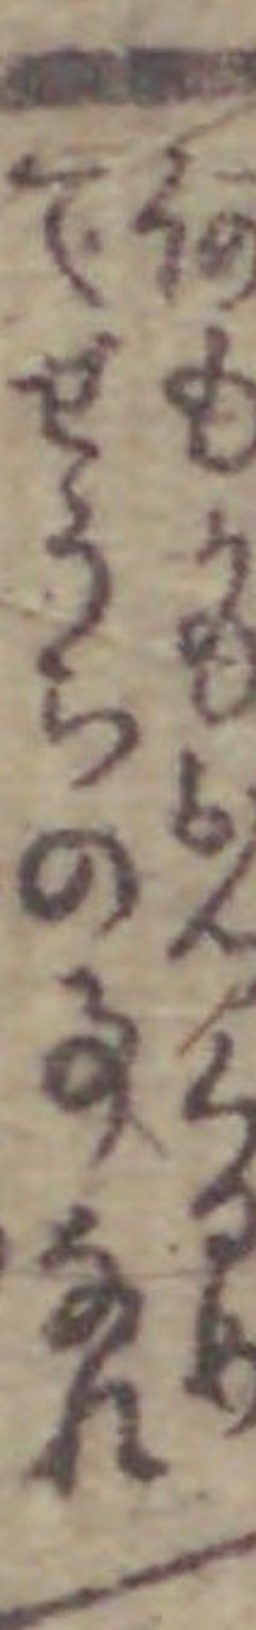てせうちの事なれ
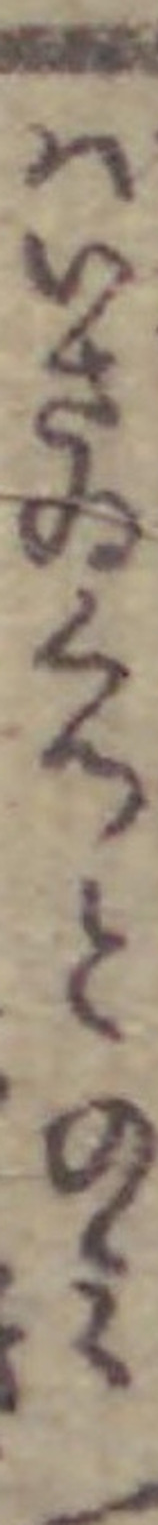はいさゐくつとのみ
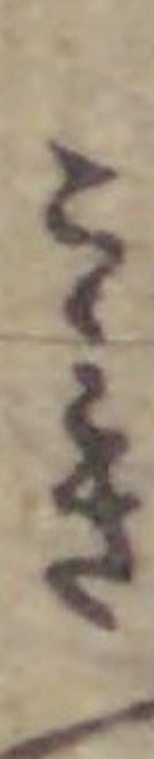こみさ
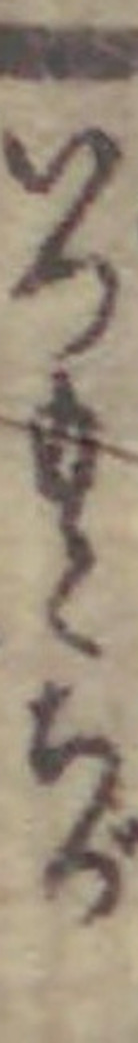いつもとちが
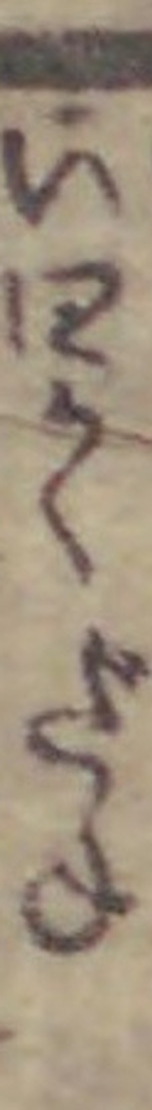い四かくだね
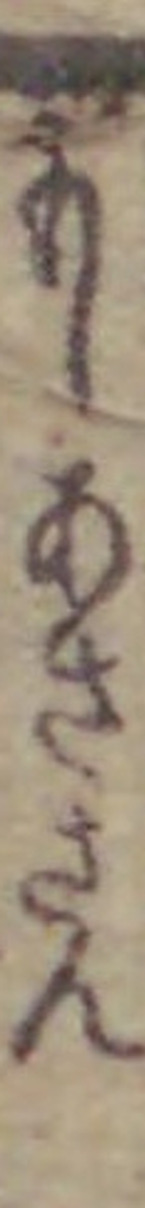もしあささん
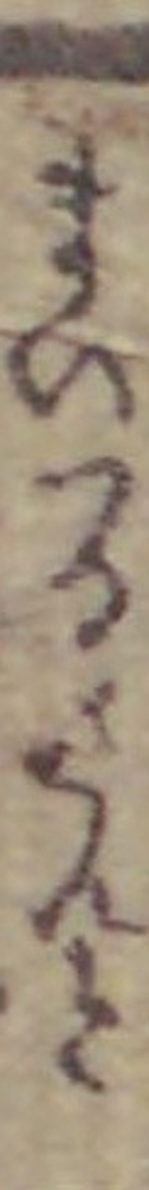まいつるさんと
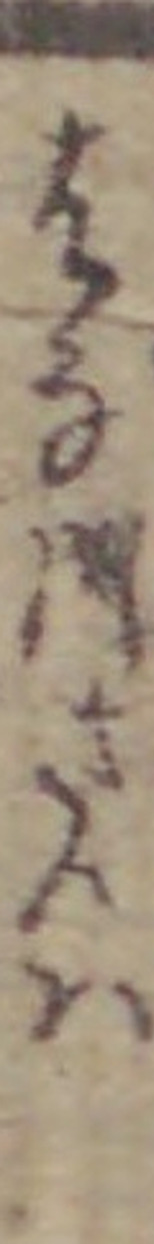はなさんは
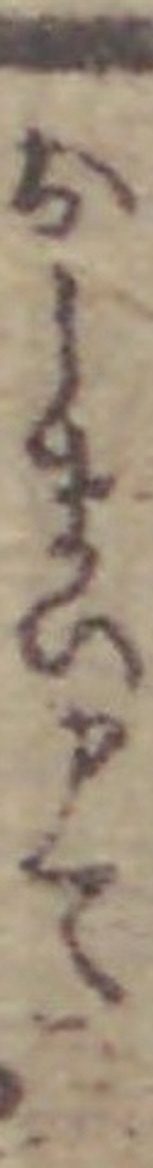おしまい申て
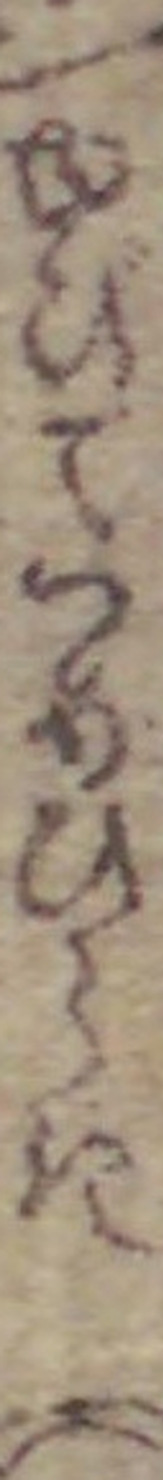ゆびてつめひらき
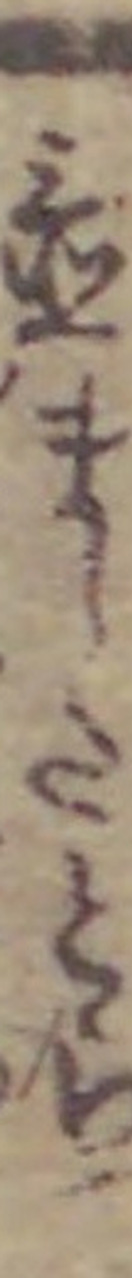置ましたとら
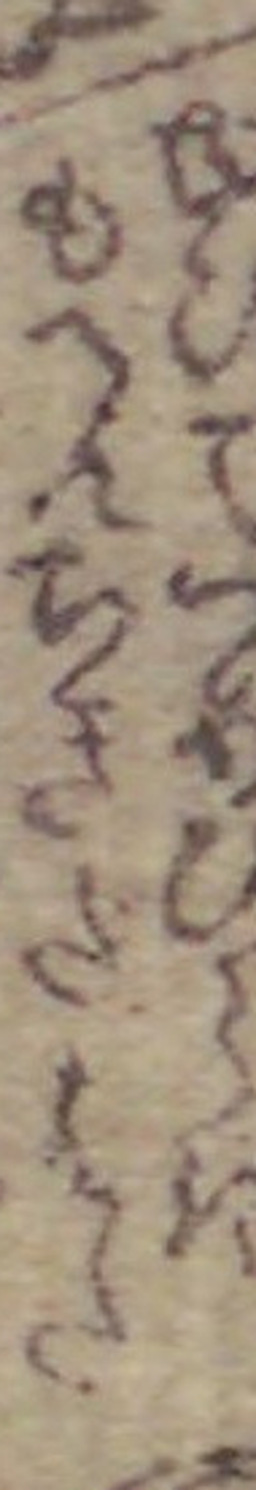もへんちきだはた
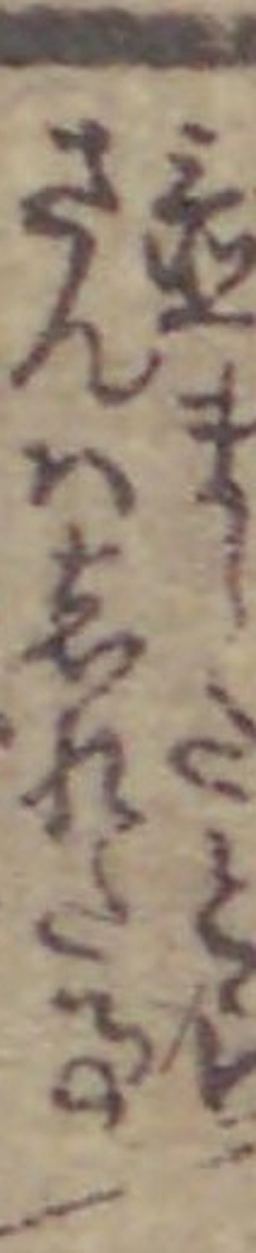さんはしれた事
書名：間似合嘘言曽我 3巻
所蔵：国立国会図書館 National Diet Library, JAPAN
